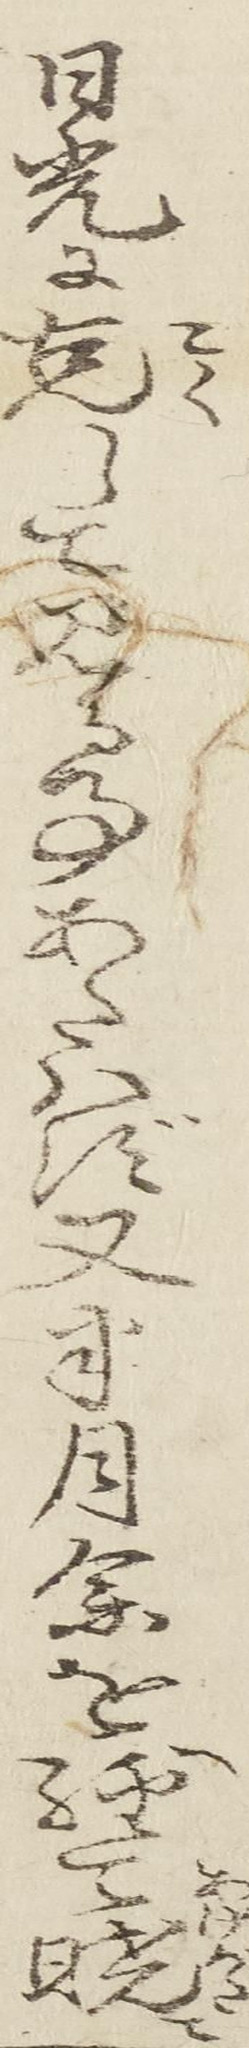日光に克して見る事あたはず又半月余を経て暁ニ
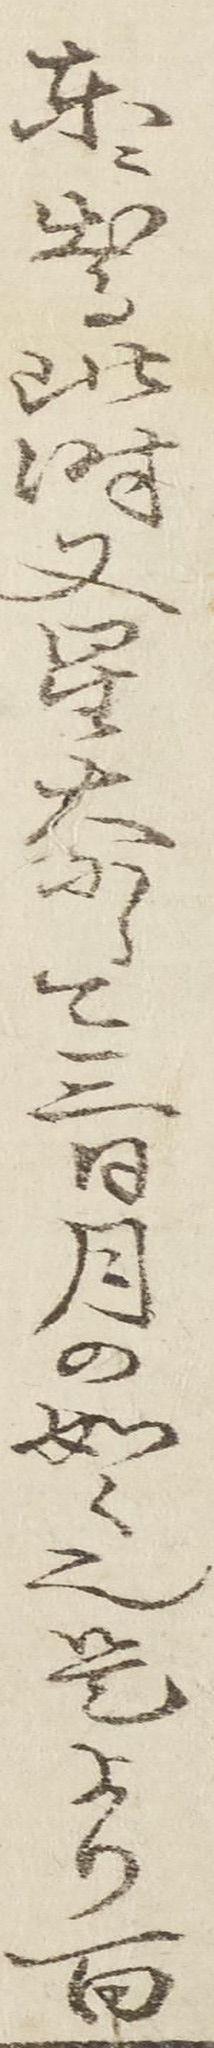東に出る此時又星大にして三日月の如く也是より百
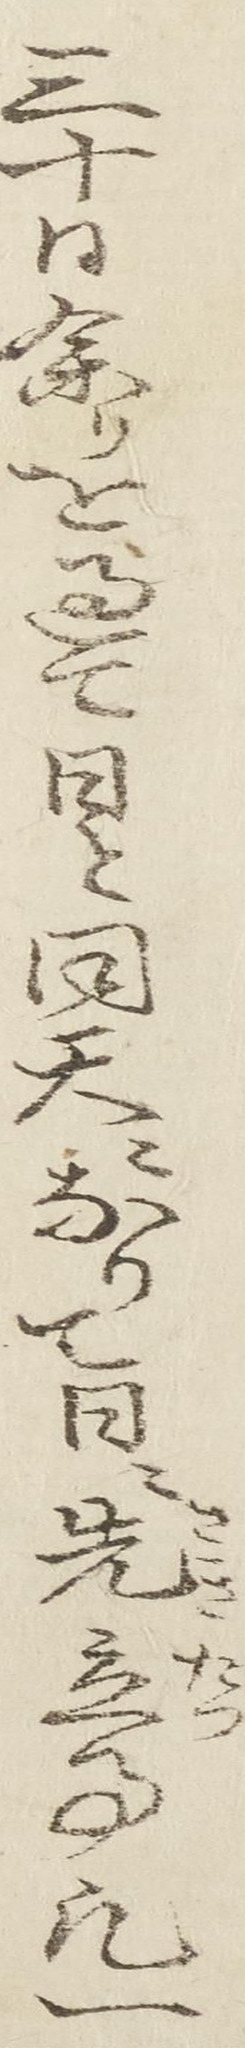三十日余りを過て日と同天ニなりて日ニ先立事凡一
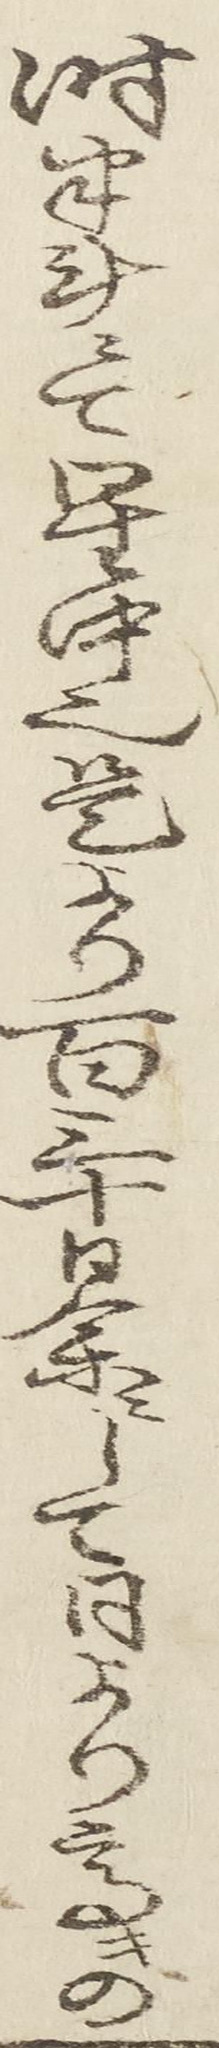時半計ニて星中也是より百三十日余ニして日より高キの
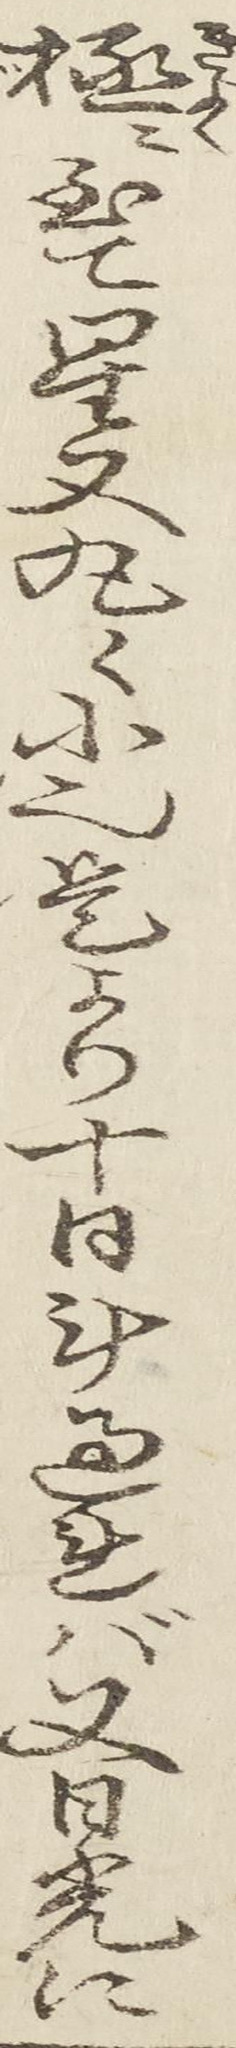極ニ至て星又丸く小也是より十日計過れば又日光に
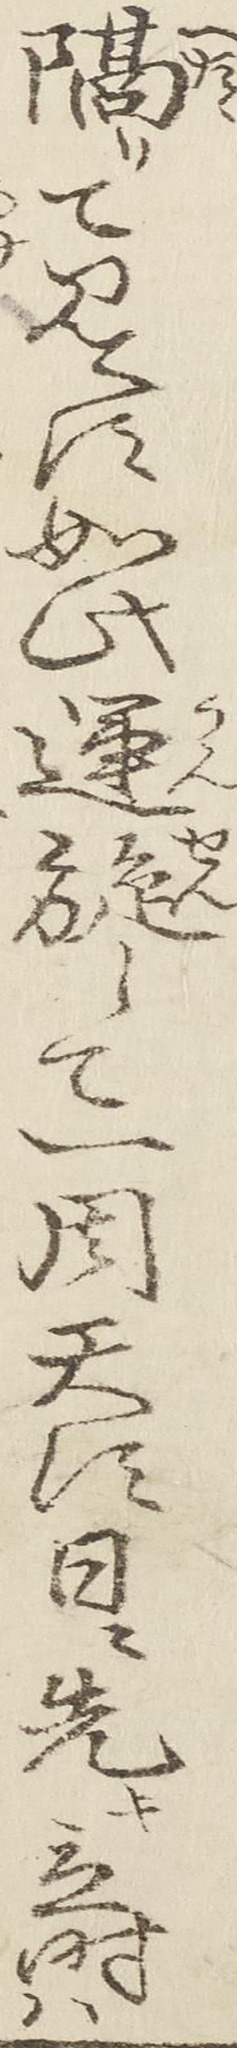隔りて見へす如此運旋して一周天す日ニ先キ立時は
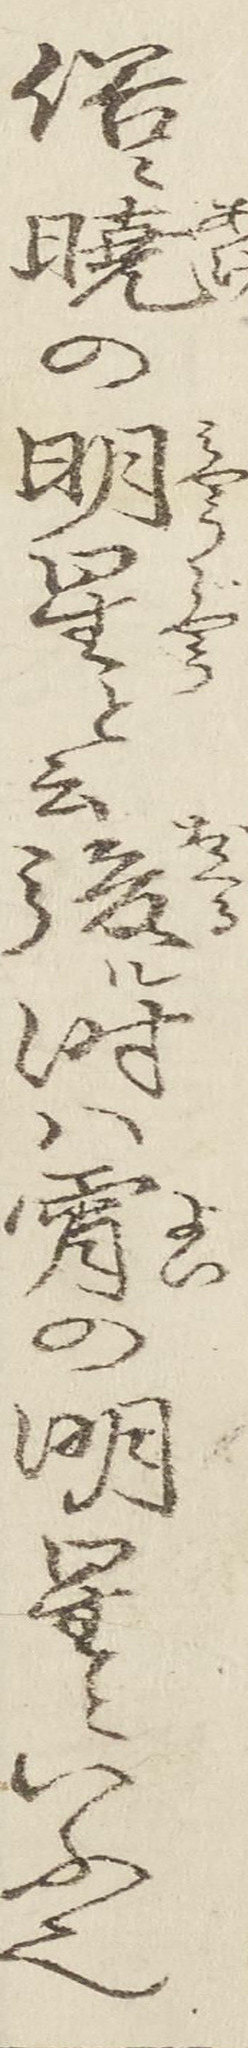俗ニ暁の明星と云後ル時は宵の明星といふ也
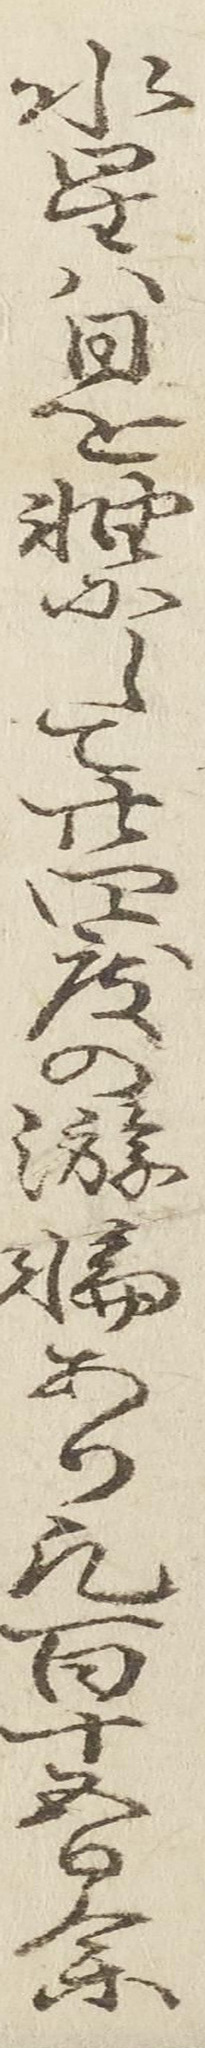水星は日を軸にして廿四度の游輪あり凡百十五日余
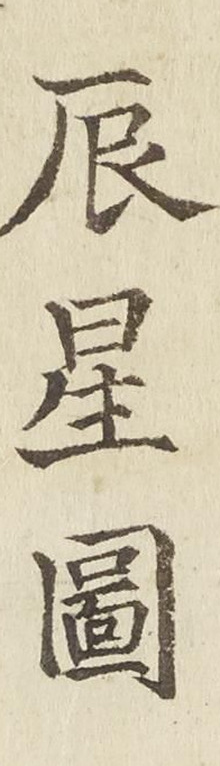辰星図
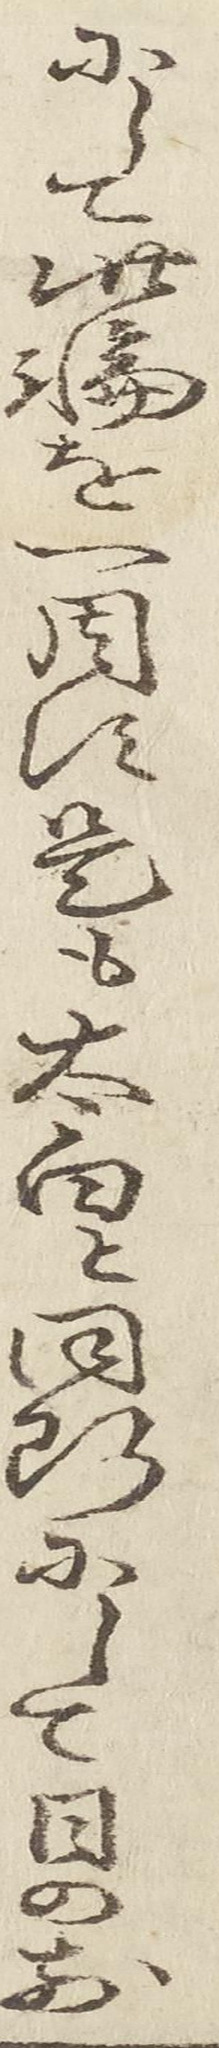にして此輪を一周す是も太白と同断にして日の前
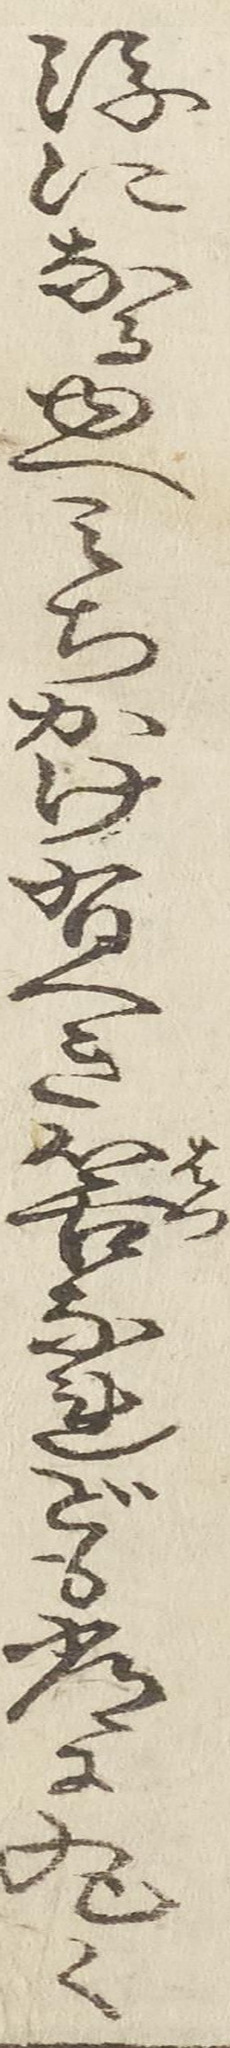後になるゆへみちかけ有へき筈なれども常に丸く
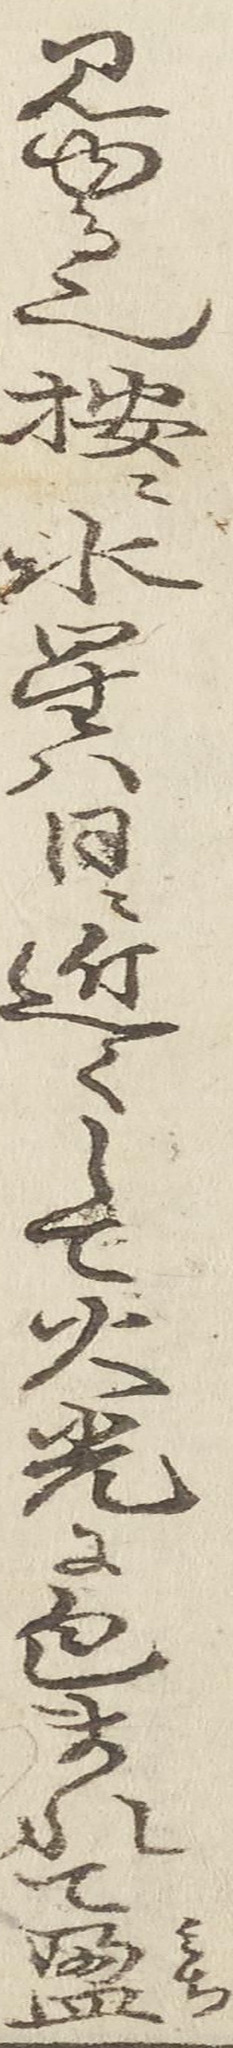見ゆる也按ニ水星は日ニ近くして火光に包まれて盈
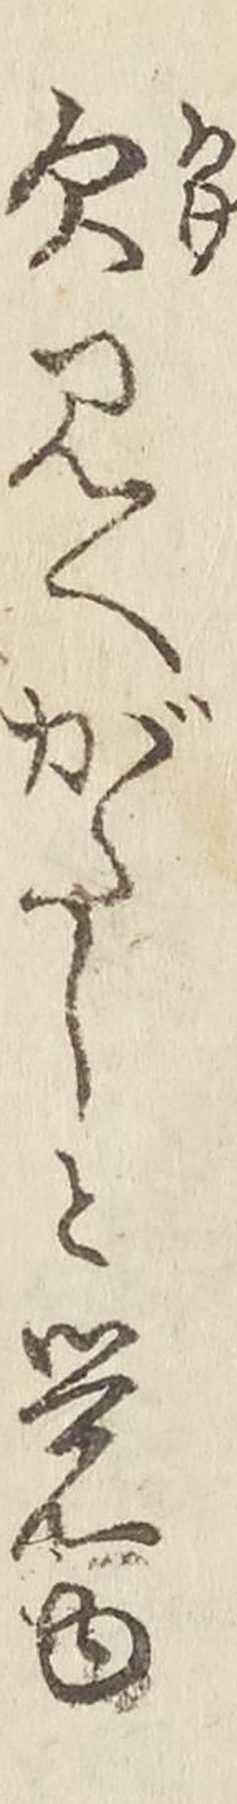欠見へがたしと覚ゆ
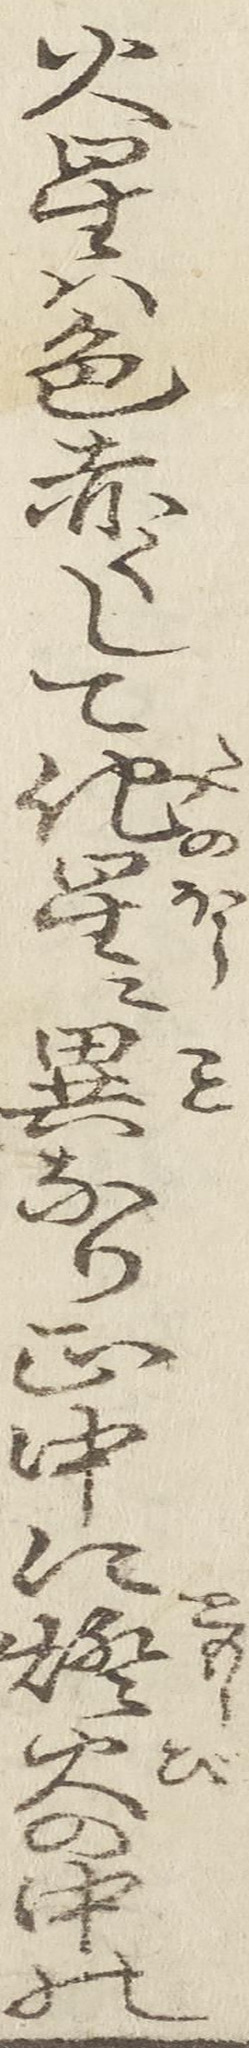火星は色赤くして他星ニ異なり正中に燈火の中の
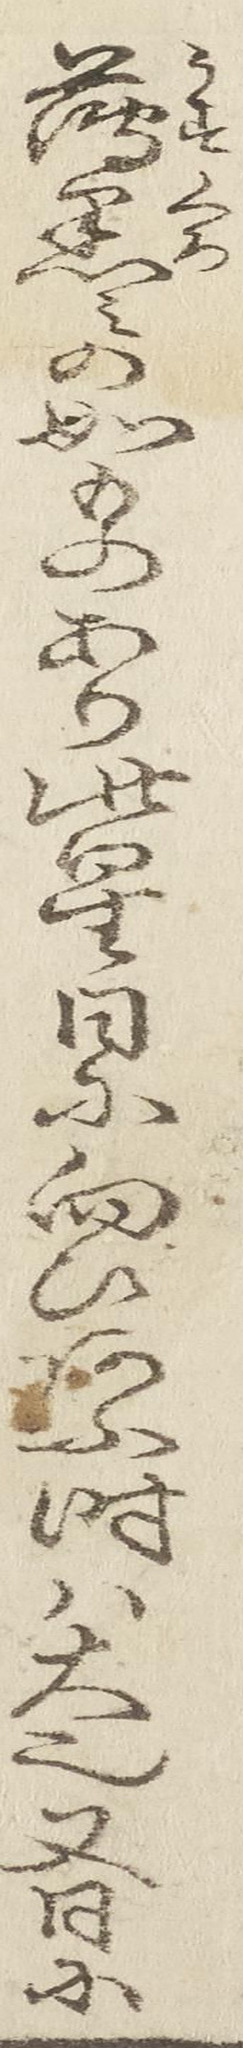薄黒みの如ものあり此星日に向ひあふ時は大也又日に
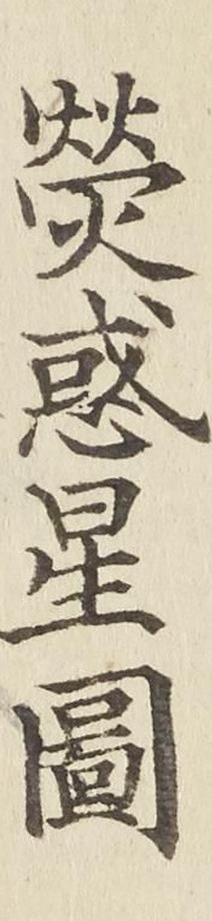熒惑星図
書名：平天儀圖解
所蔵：東京大学地震研究所図書室 Earthquake Research Institute Library, The University of Tokyo, JAPAN
